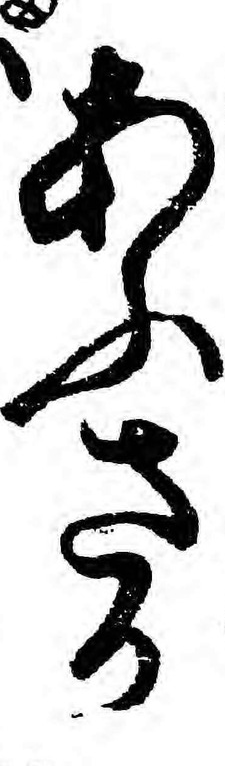あふさか
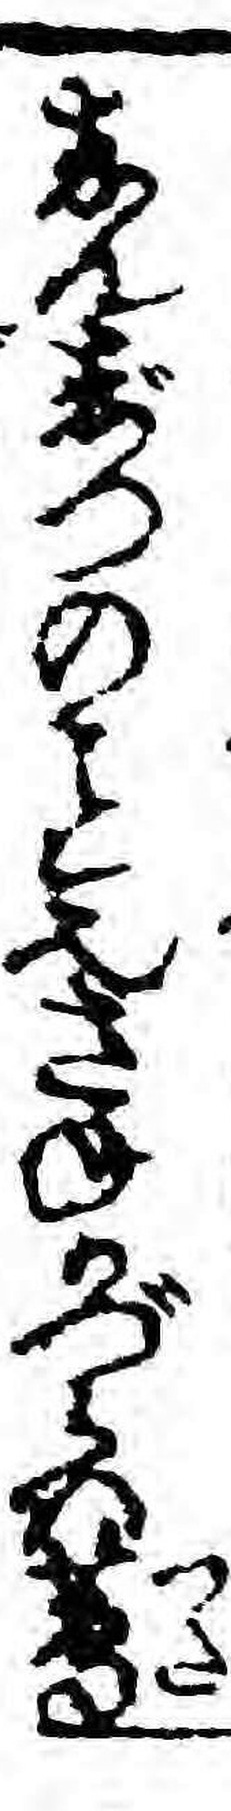しんじつのこと也さねかづらは蔦
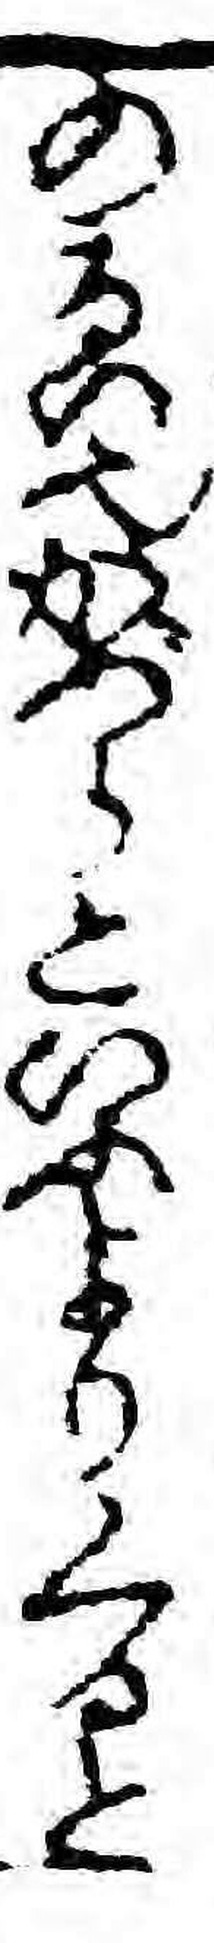のるい也かづらといふよりくると
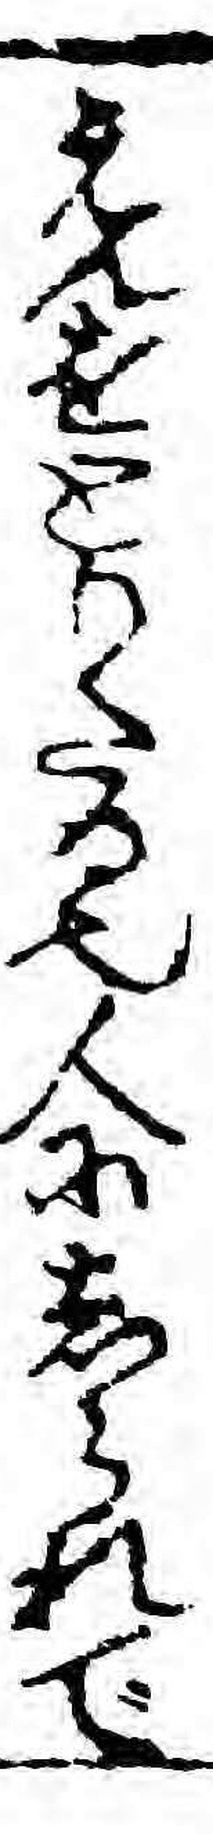えんをとりたる也人にしられで
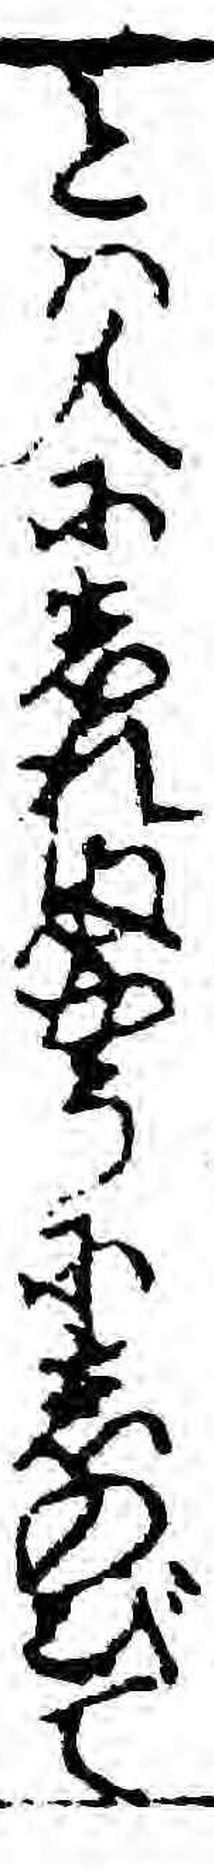とは人にしられぬやうにしのびて
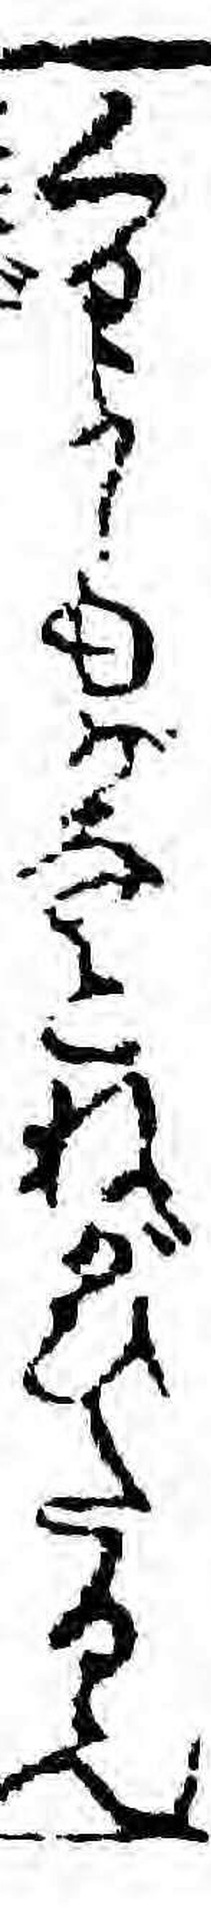くるよしもがなとねがひたる也
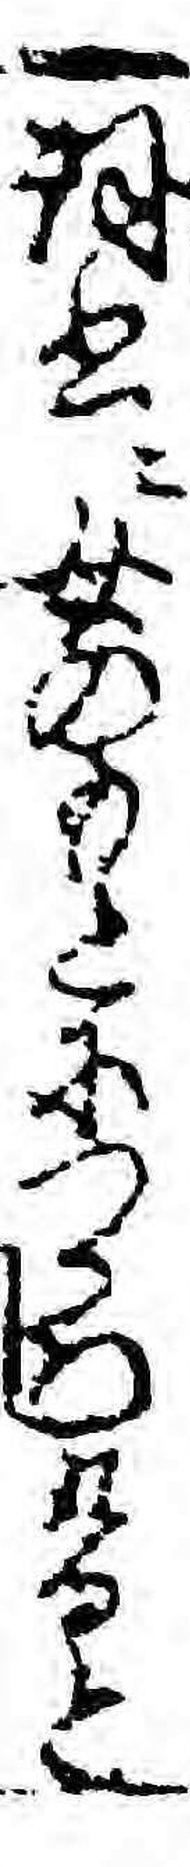詞書に女のもとにつかはしけると
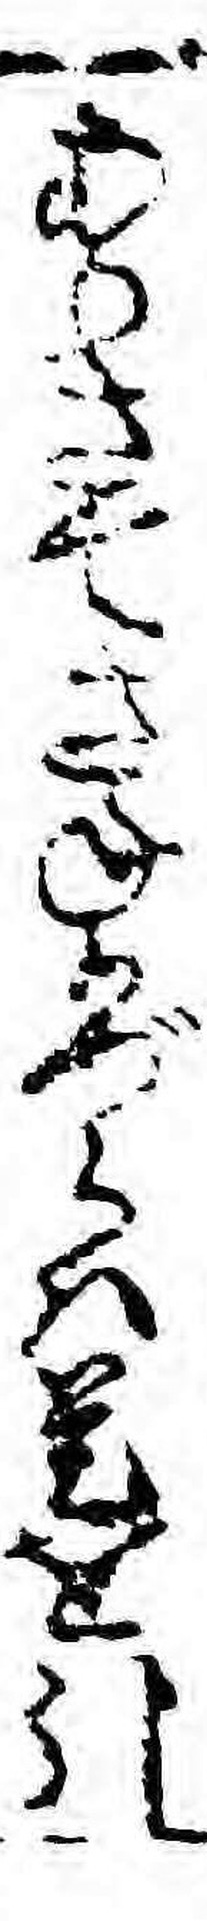ありさてさねかづらは是を引
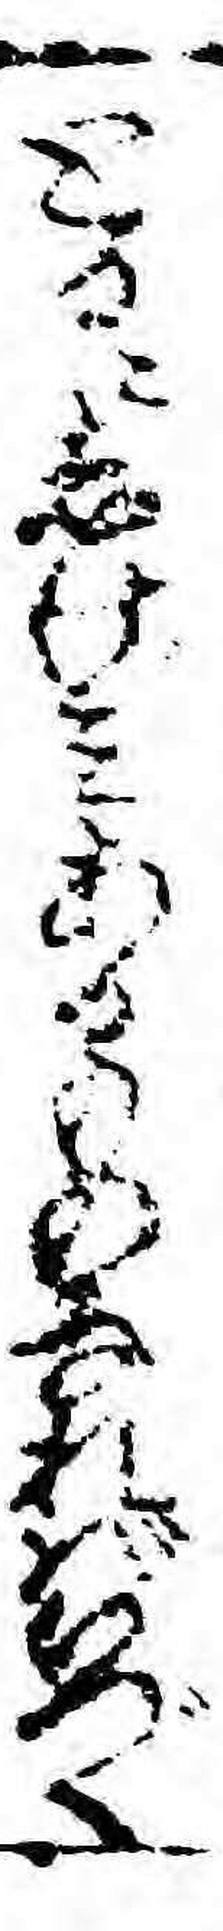とるにしげみあるものなればいづく
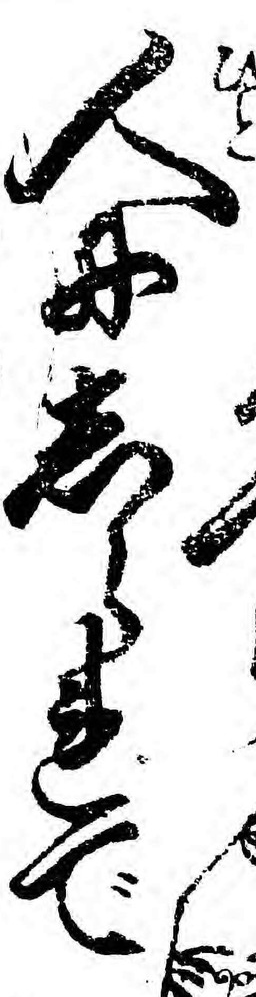人にしられで
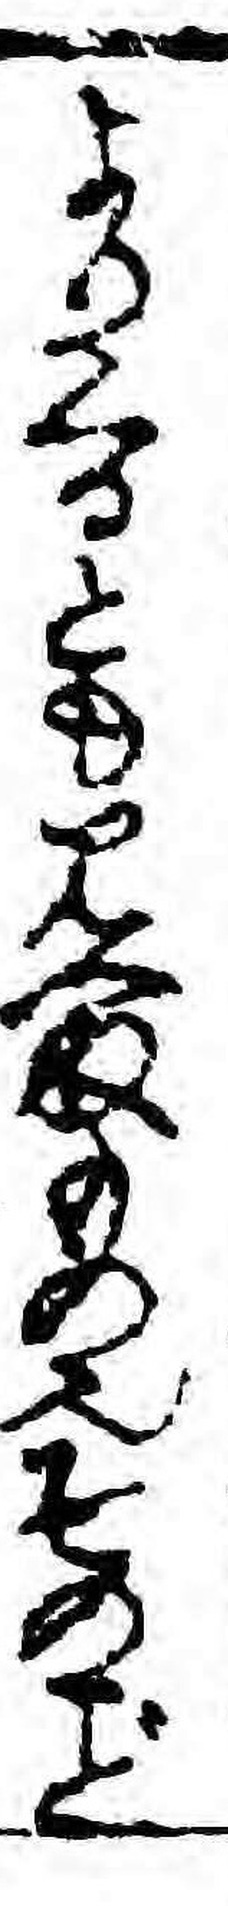よりくるとも見へぬもの也そのごと
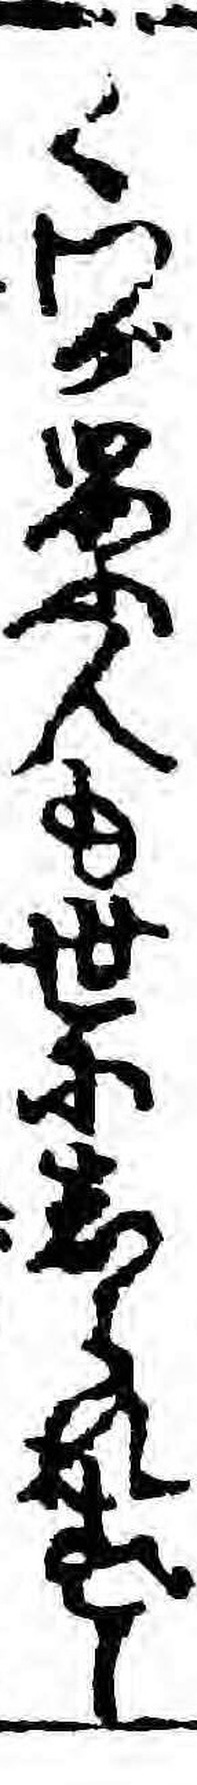くわが思ふ人も世にしられずし
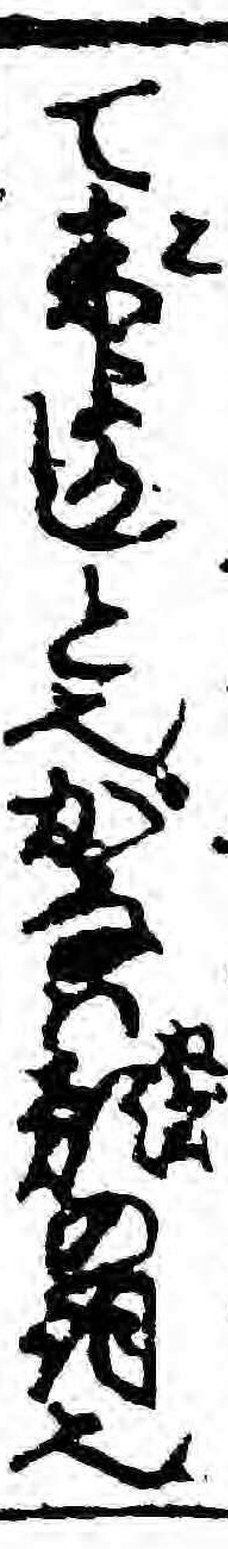て来よかしと也がなは願の詞也
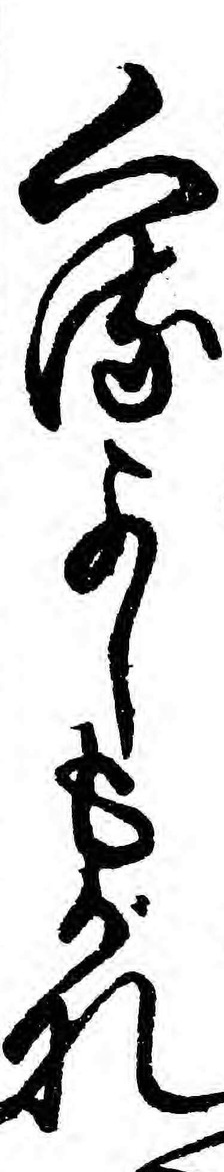くるよしもがな

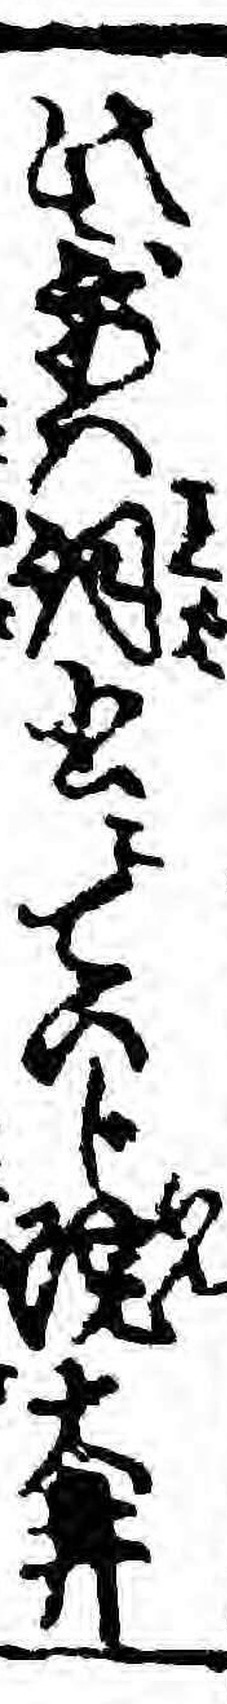此哥は詞書にてていじ院大井
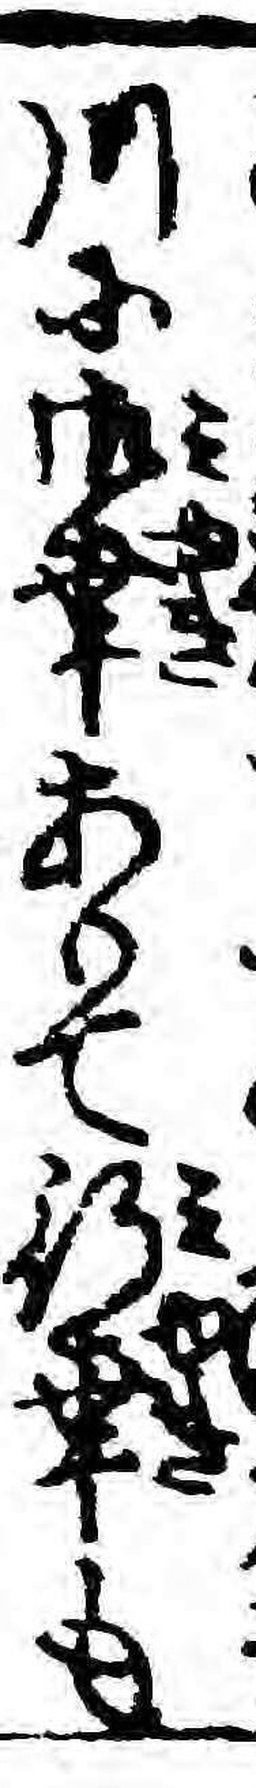川に御幸ありて行幸も
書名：頭書和歌注譯／壽賀多百人一首小倉錦
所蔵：国文学研究資料館
